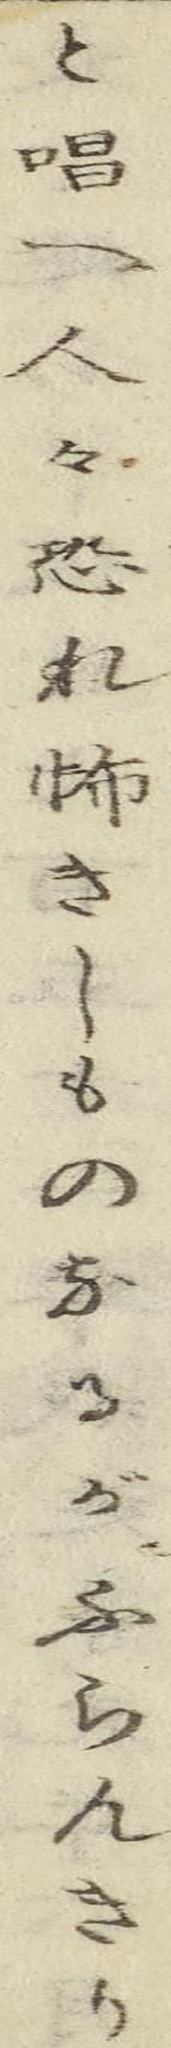と唱へ人々恐れ怖きしものなるが「ふらんきり
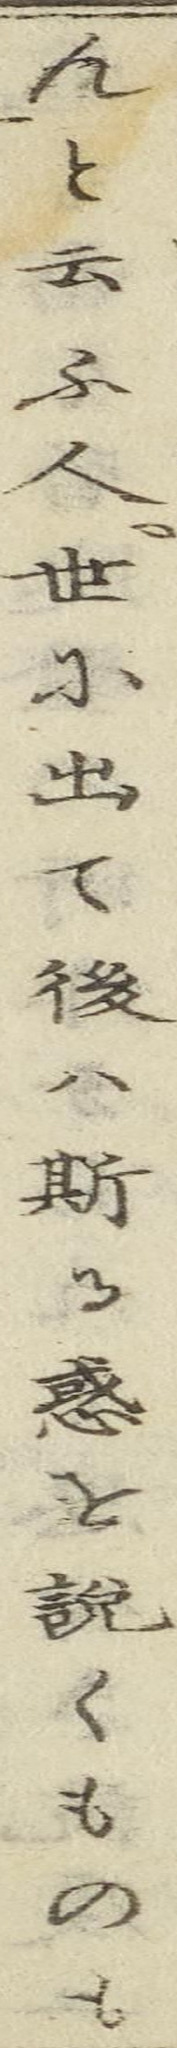ん」と云ふ人。世に出て後は斯る惑を説くものも
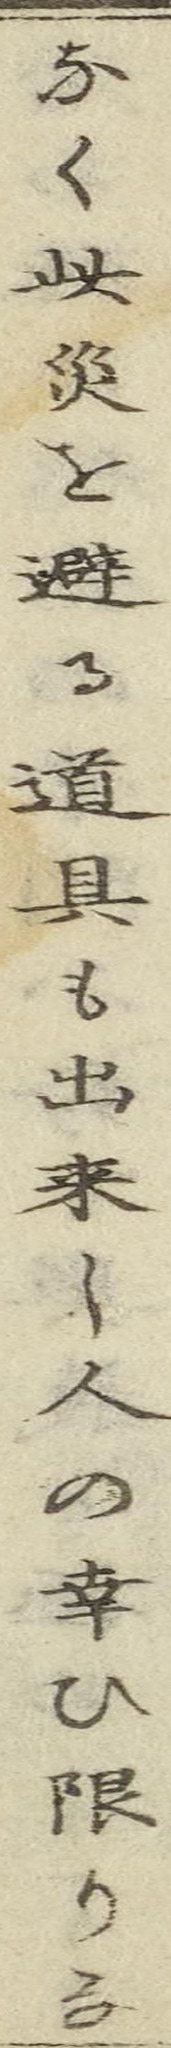なく此災を避る道具も出来し人の幸ひ限りな
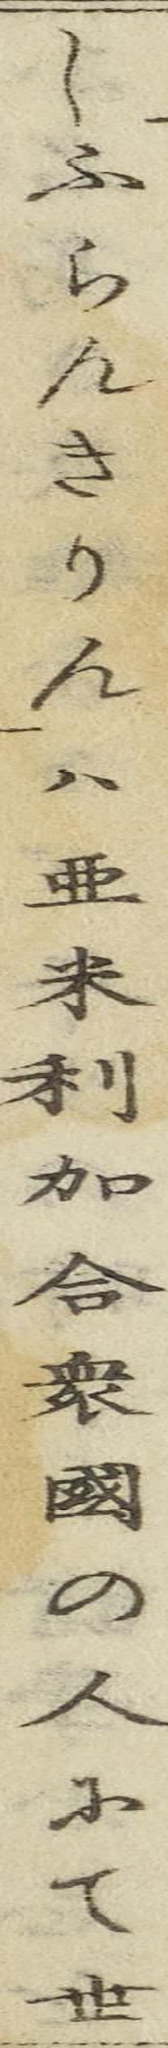し「ふらんきりん」は亜米利加合衆国の人にて世

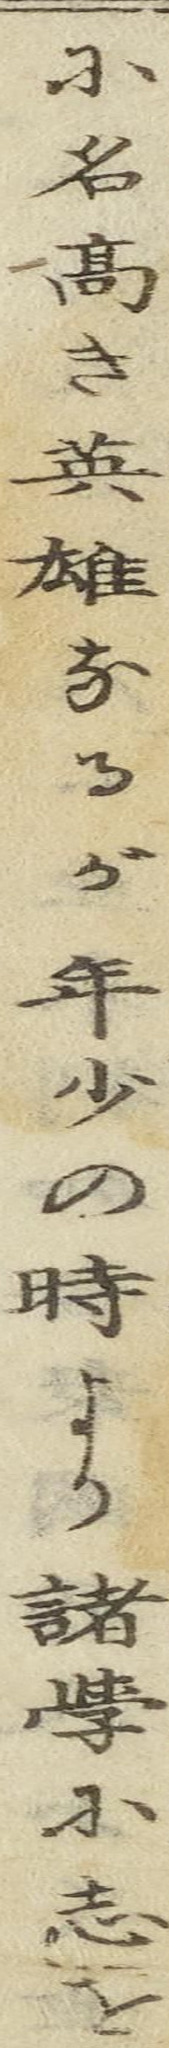に名高き英雄なるが年少の時より諸学に志を
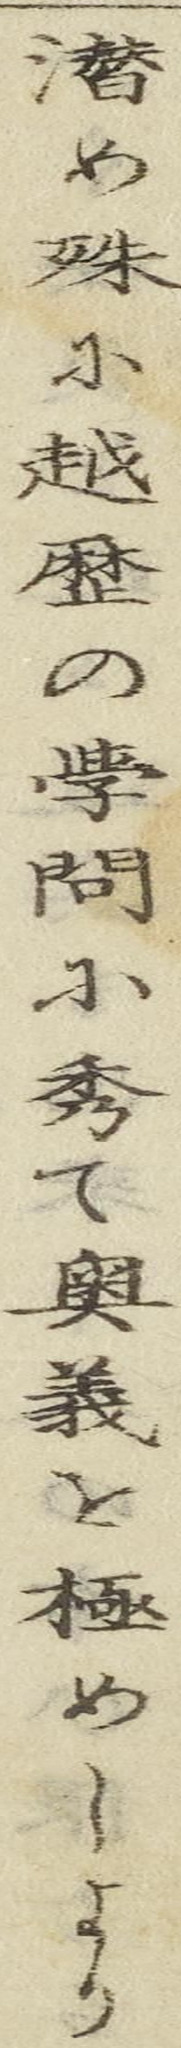潜め殊に越歴の学問に秀て奥義を極めしより
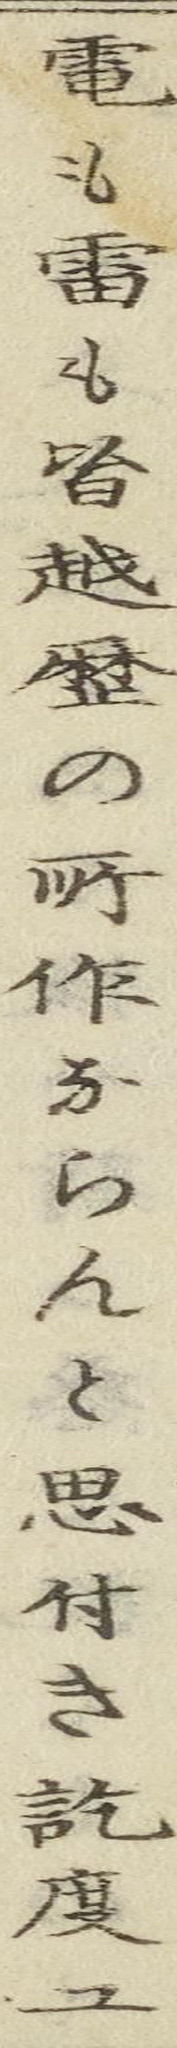電も雷も皆越歴の所作ならんと思付き訖度工
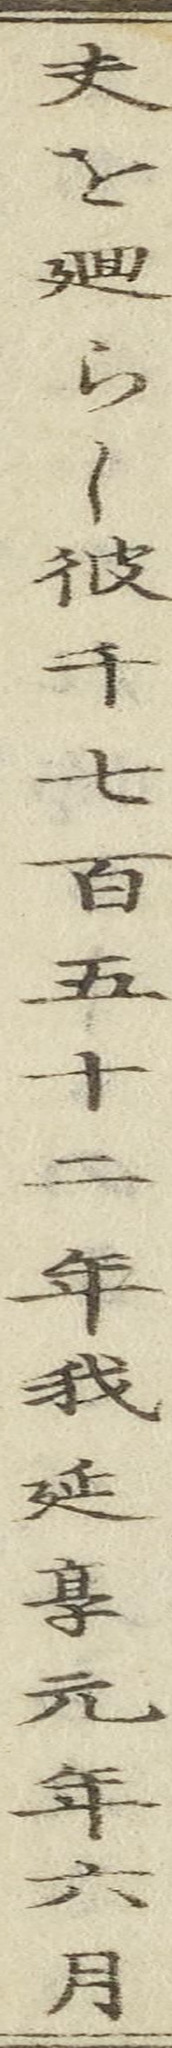夫を廻らし彼千七百五十二年我延享元年六月
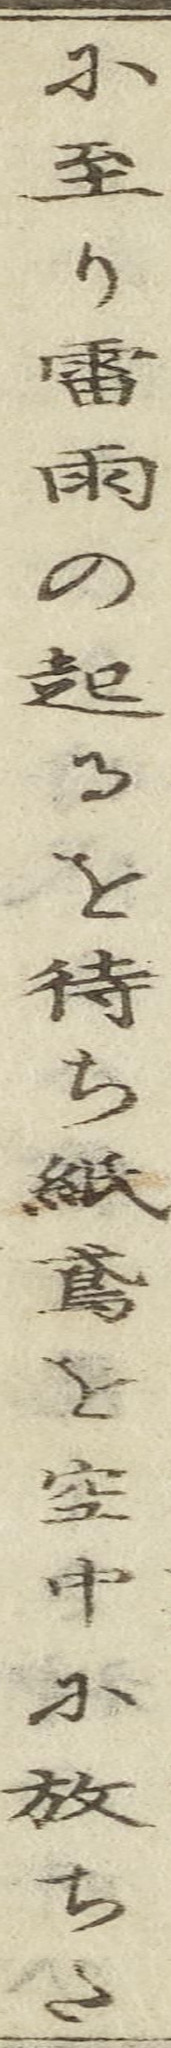に至り雷雨の起るを待ち紙鳶を空中に放ちた
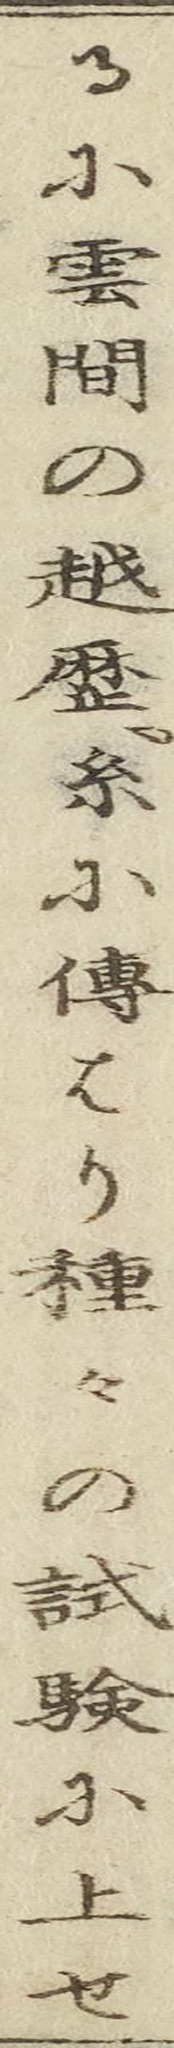るに雲間の越歴。糸に伝はり種々の試験に上せ
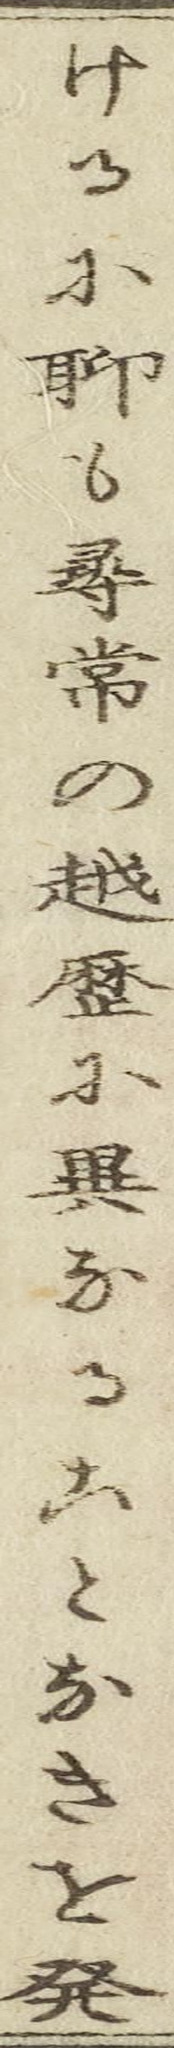けるに聊も尋常の越歴に異なることなきを発
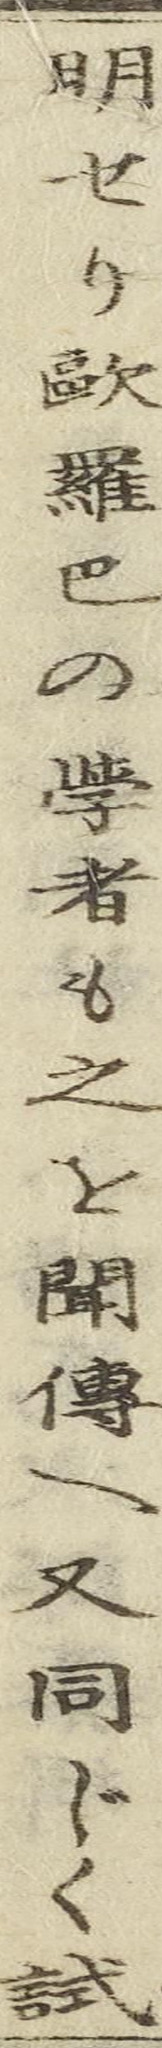明せり欧羅巴の学者も之を聞伝へ又同じく試
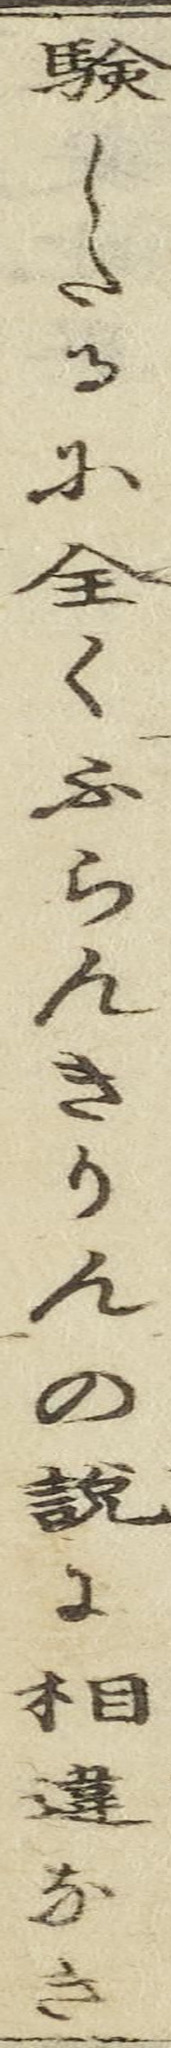験したるに全く「ふらんきりん」の説に相違なき
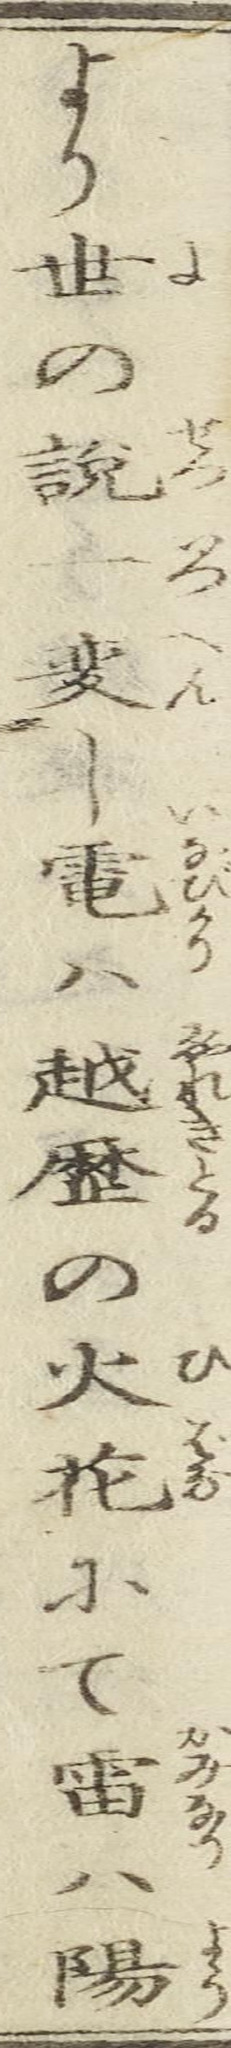より世の説一変し電は越歴の火花にて雷は陽
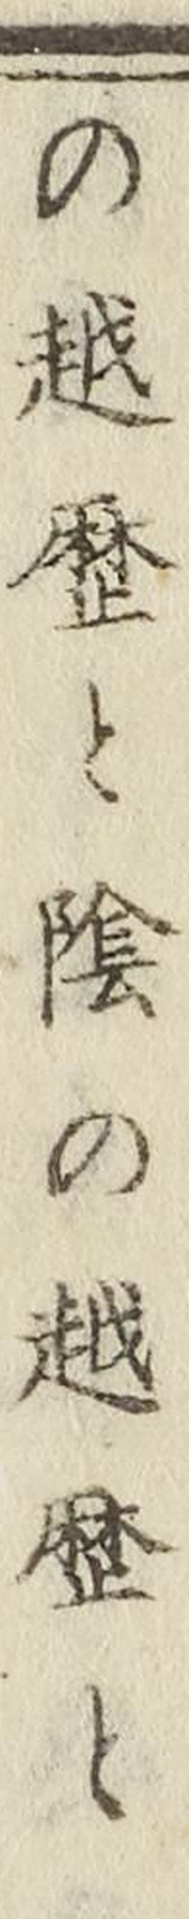の越歴と陰の越歴と
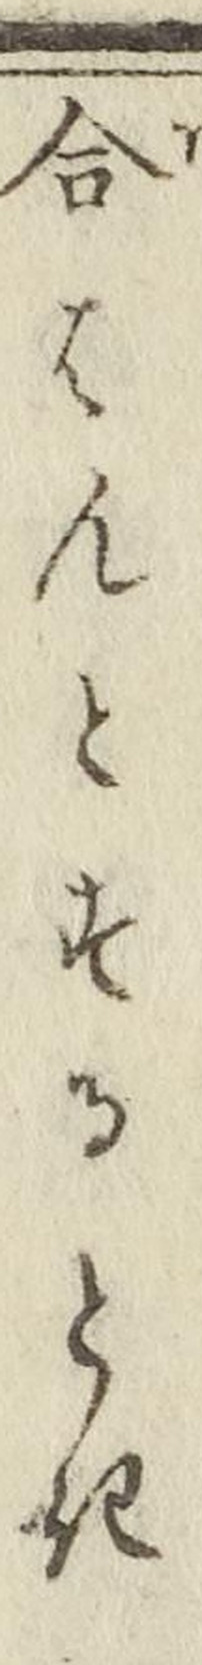合はんとするとき
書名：天変地異
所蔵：東京大学地震研究所図書室 Earthquake Research Institute Library, The University of Tokyo, JAPAN
